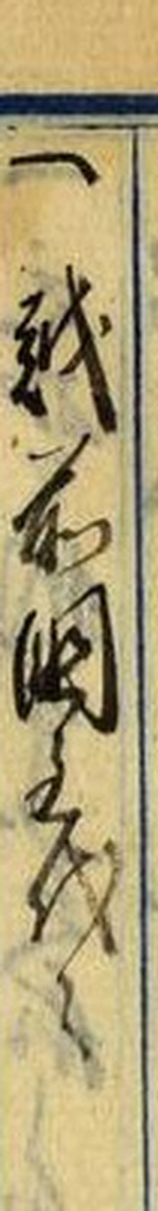一越前国主代々
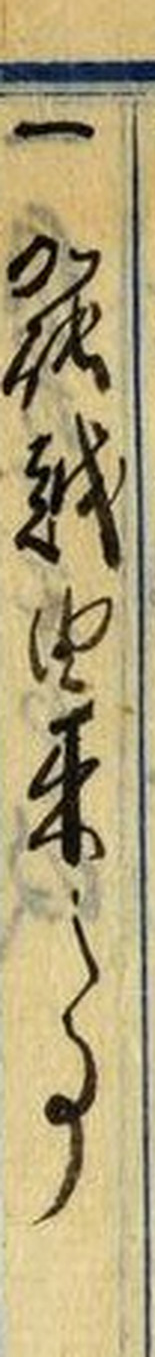一加能越由来之事
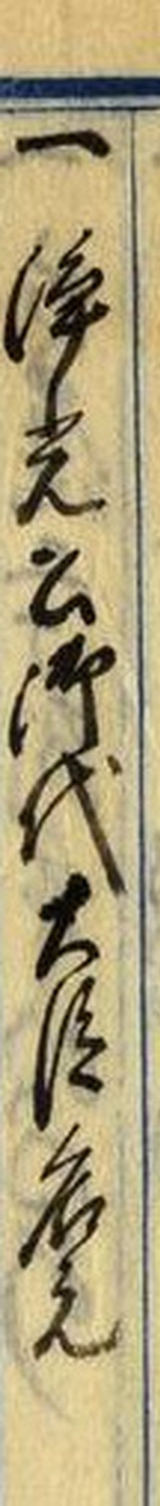一浄光公御代大臣名元
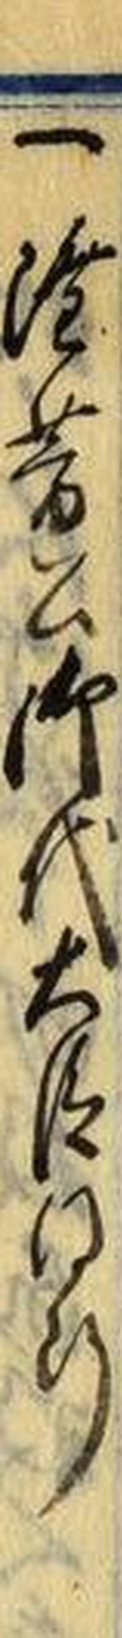一隆芳公御代大臣同断
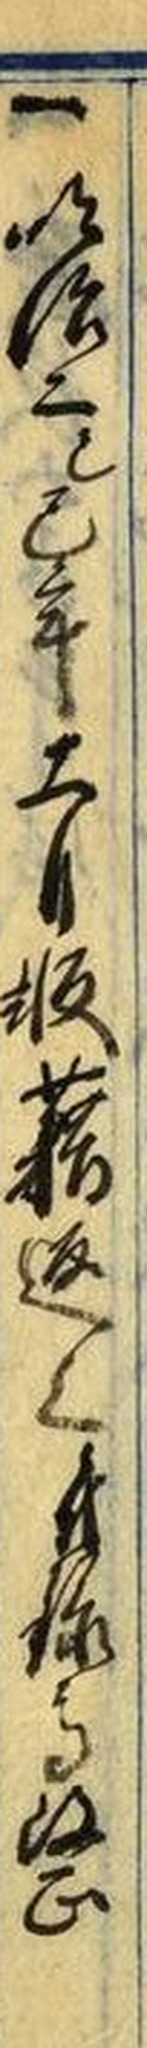一明治二己巳年十一月版籍返上に付禄高改正
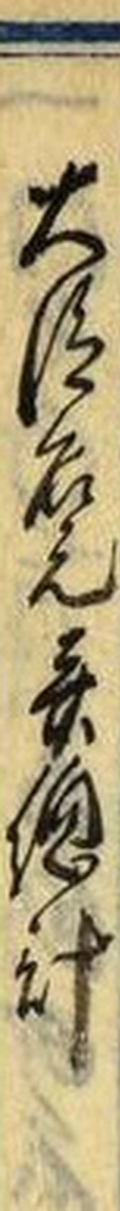大臣名元并総計

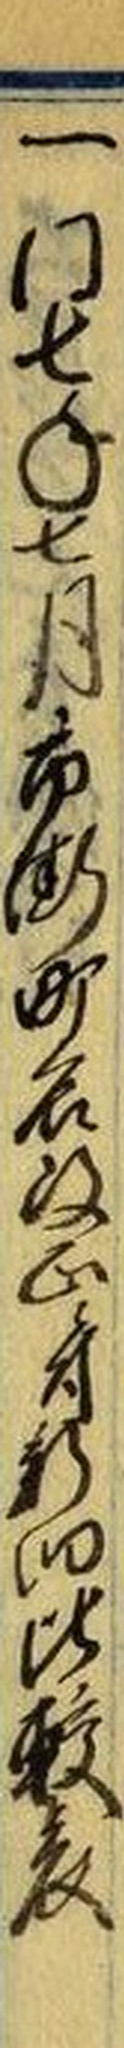一同七年七月市街町名改正に付新旧比較表
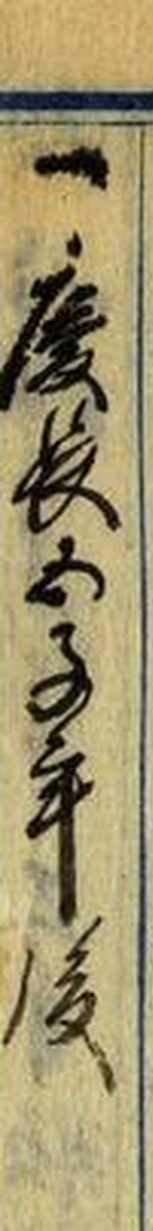一慶長五子年後
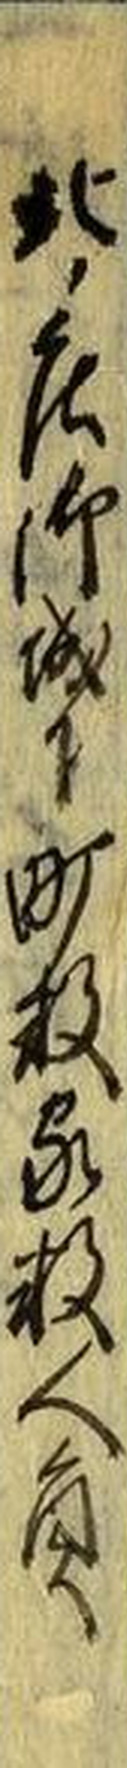北ノ庄御城下町数家数人員
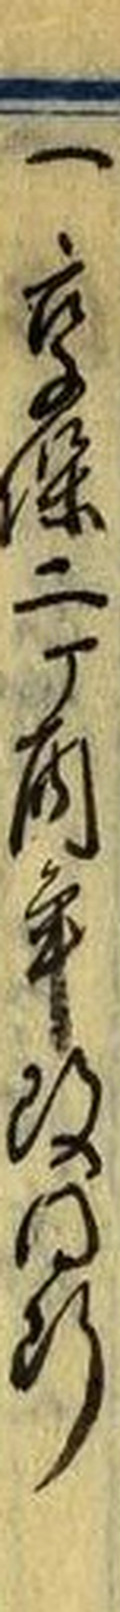一享保二丁酉年改同断
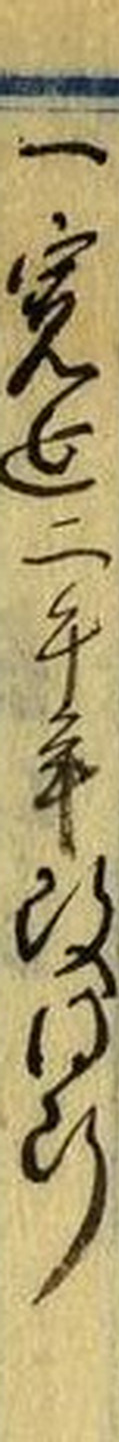一寛延二午年改同断
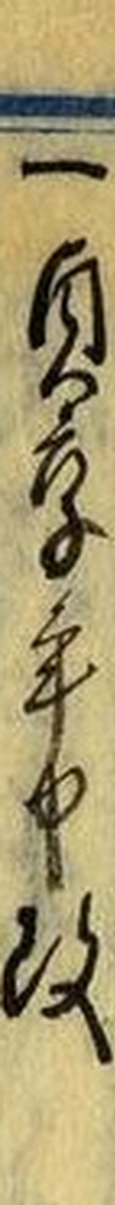一貞享年中改
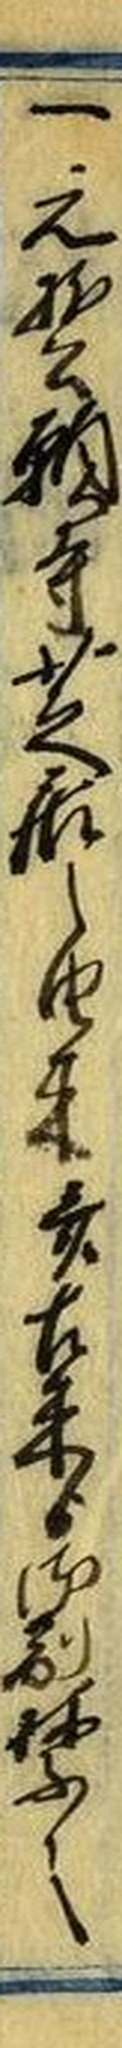一元誓願寺芝居之由来并古来ゟ御制禁之
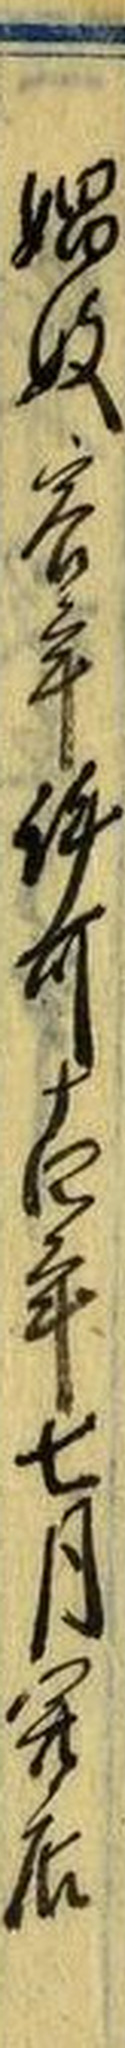娼妓客年許可十四年七月開店
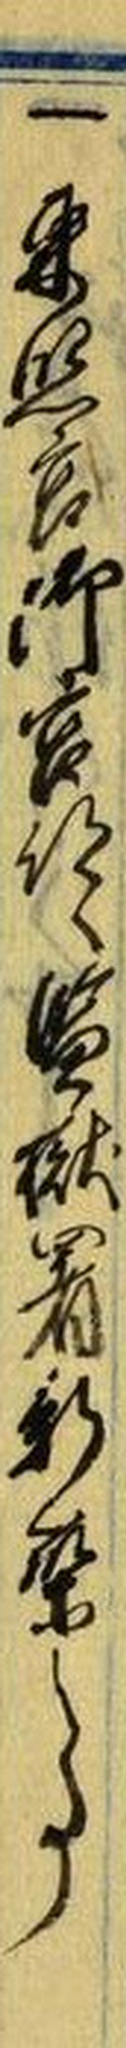一東照宮御宮跡へ監獄署新築之事
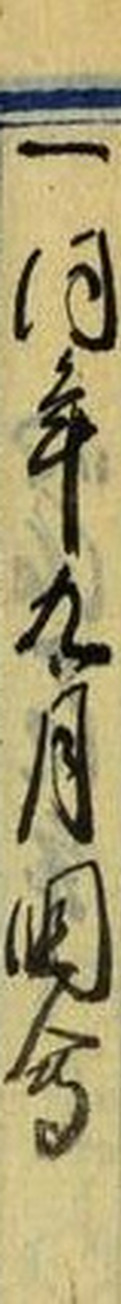一同年九月国会
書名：温古集 五巻
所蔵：福井県文書館 Fukui Prefectural Archives
